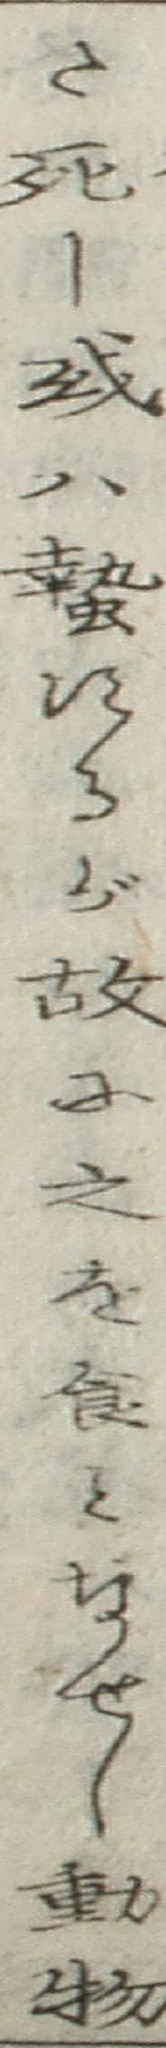た死し或は蟄するが故に、之を食となせし動物
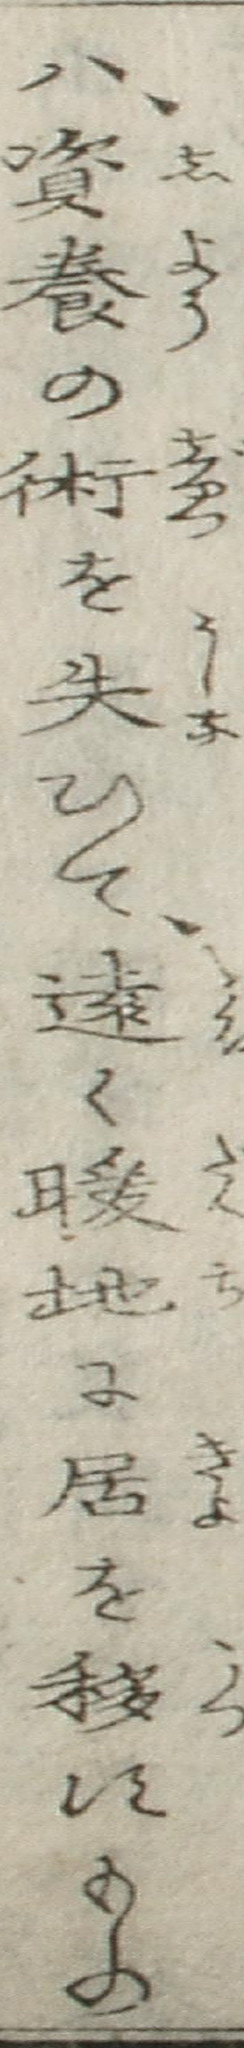は、資養の術を失ひて、遠く暖地に居を移すもの

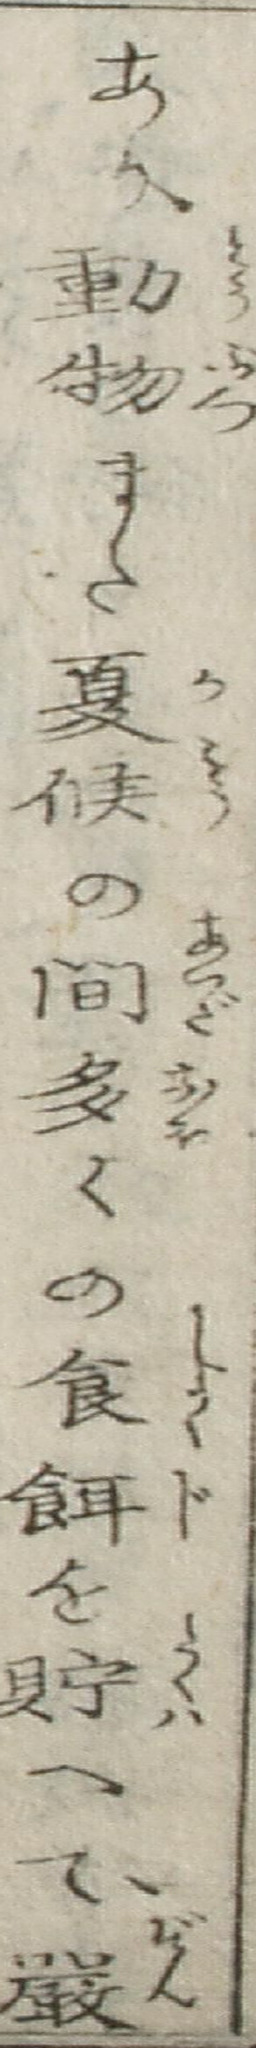あり、動物また夏候の間多くの食餌を貯へて、厳
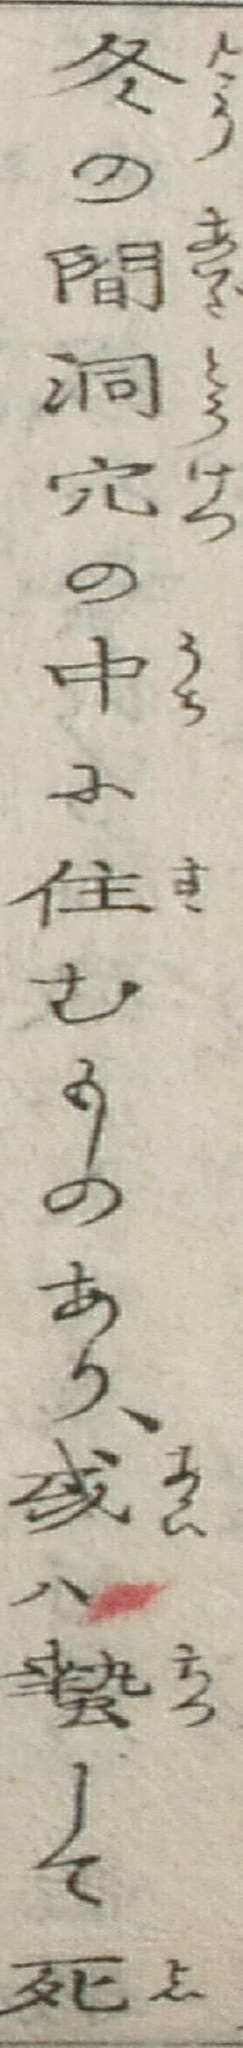冬の間洞穴の中に住むものあり、或は蟄して死
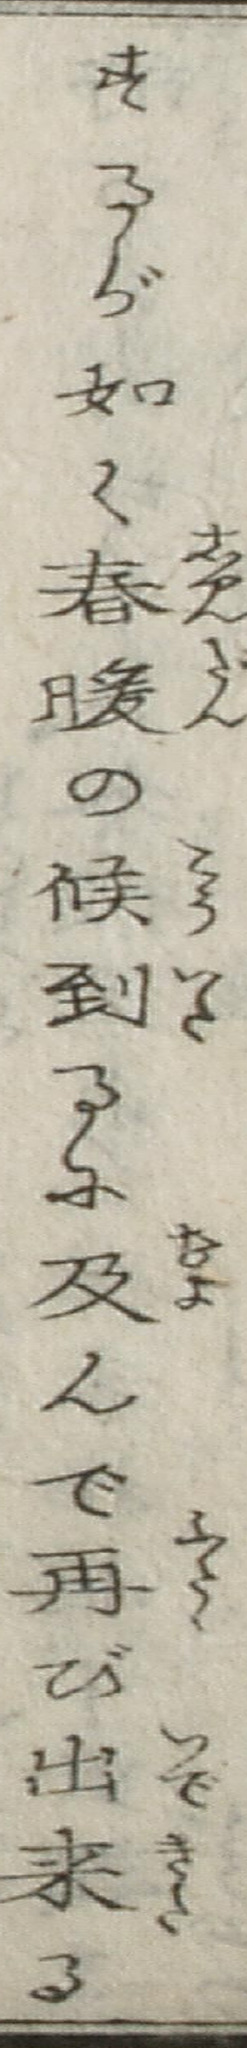するが如く春暖の候到るに及んで再び出来る
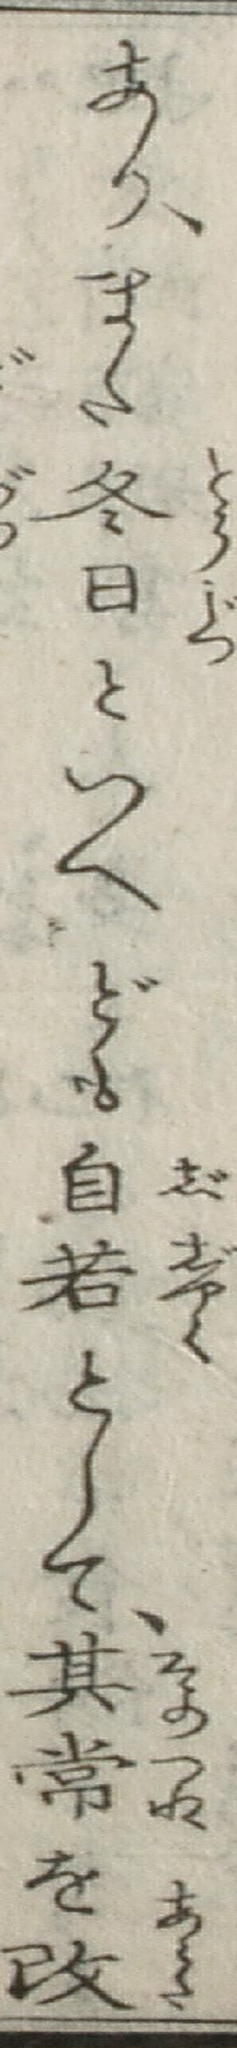あり、また冬日といへども自若として、其常を改
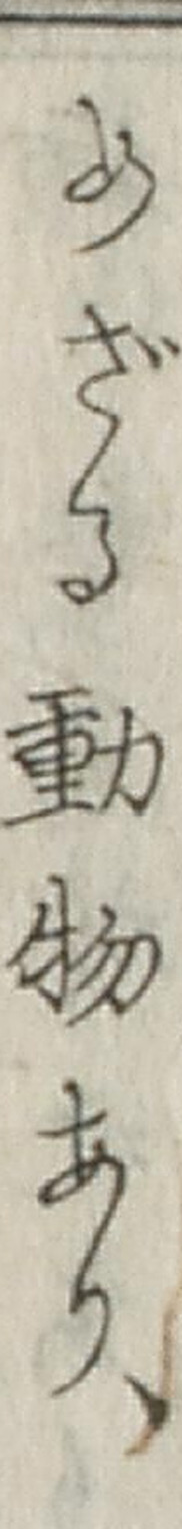めざる動物あり、
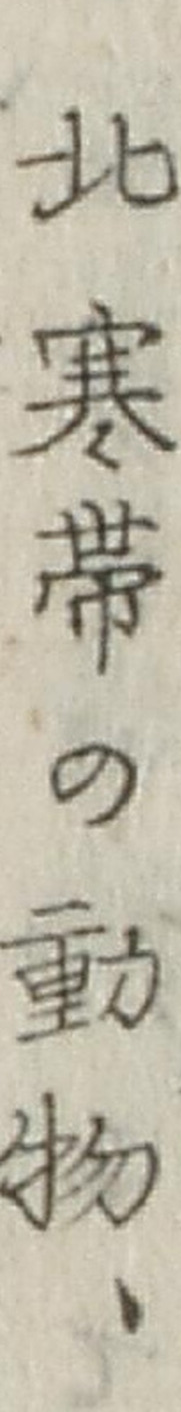北寒帯の動物、
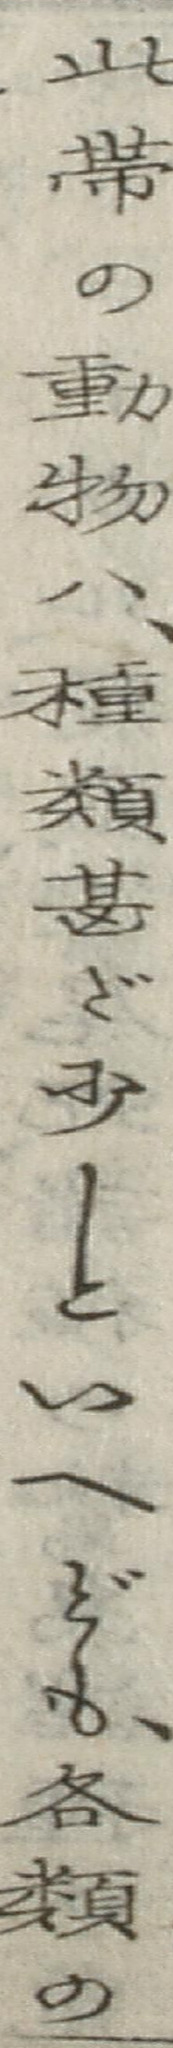此帯の動物は、種類甚だ少しといへども、各類の
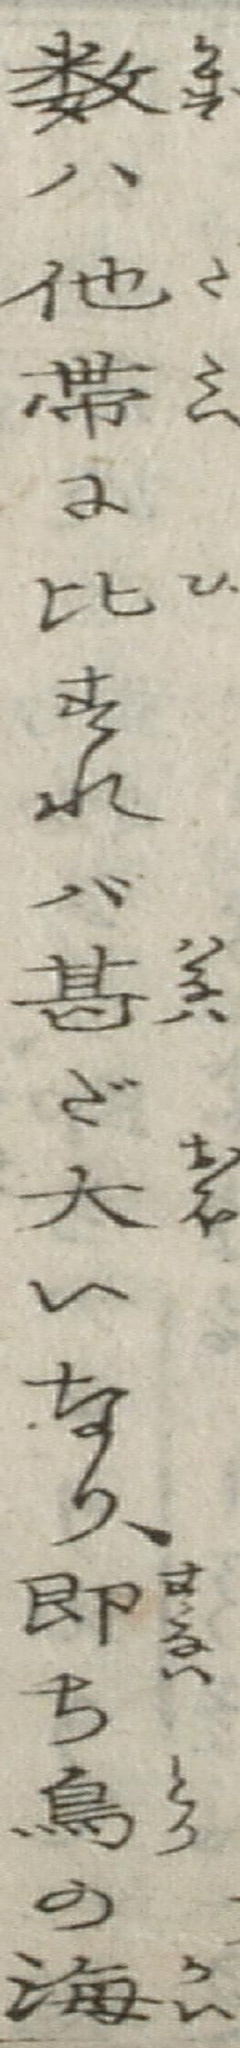数は他帯に比すれば甚だ大いなり、即ち鳥の海
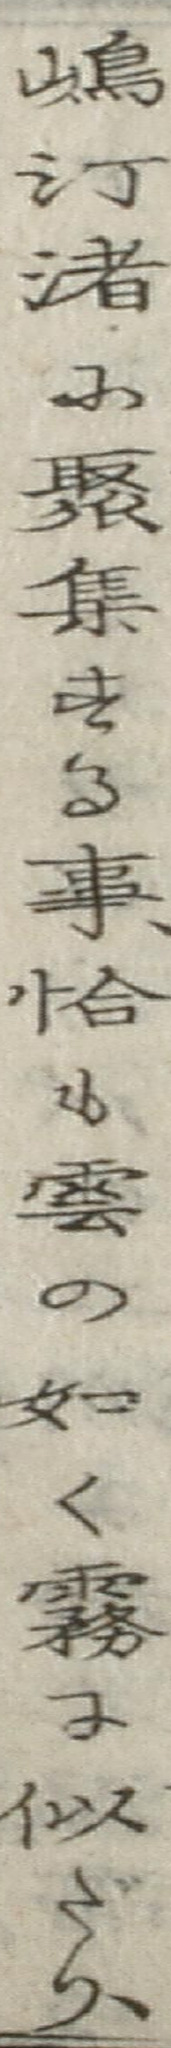嶋汀渚に聚集する事、恰も雲の如く霧に似たり、
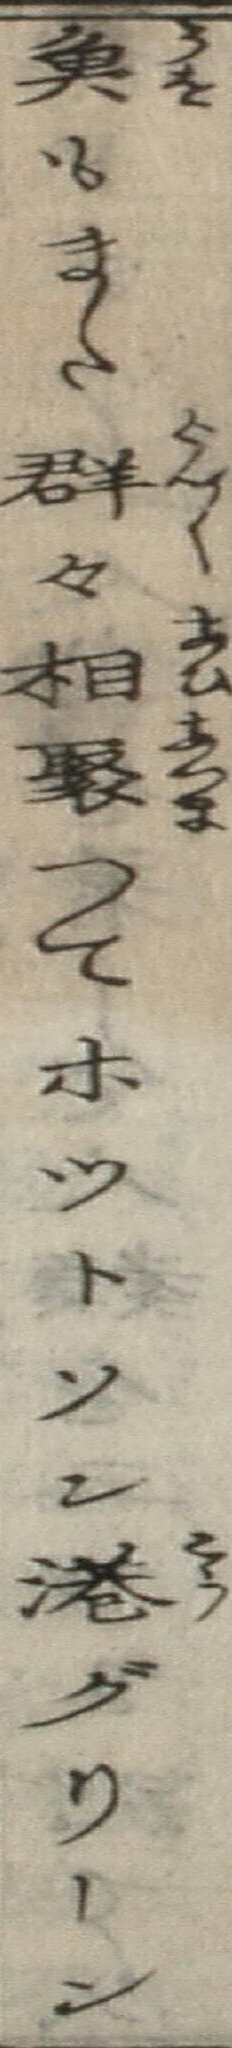魚もまた群々相聚つてホツトソン港グリーン
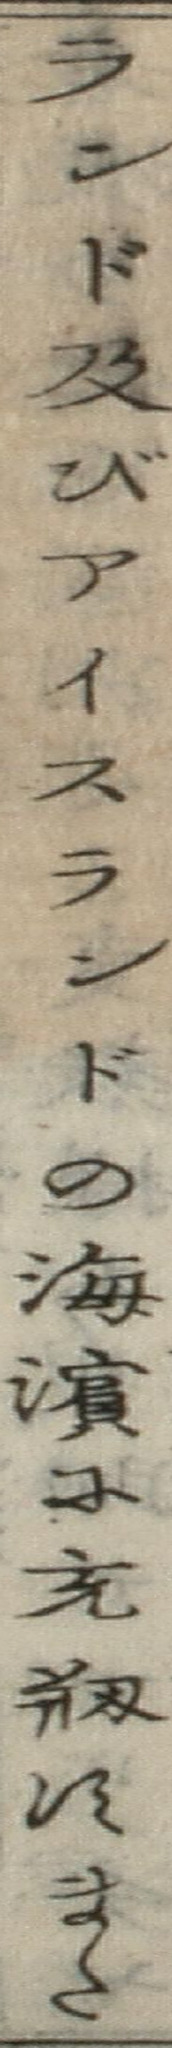ランド及びアイスランドの海浜に充剏すまた
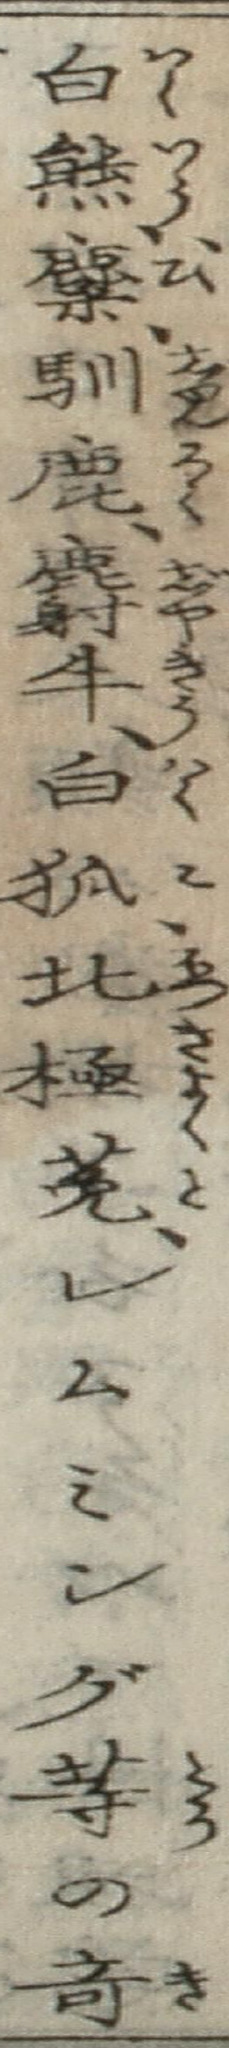白熊、麋、馴鹿、麝牛、白狐、北極兎、レムミング等の奇
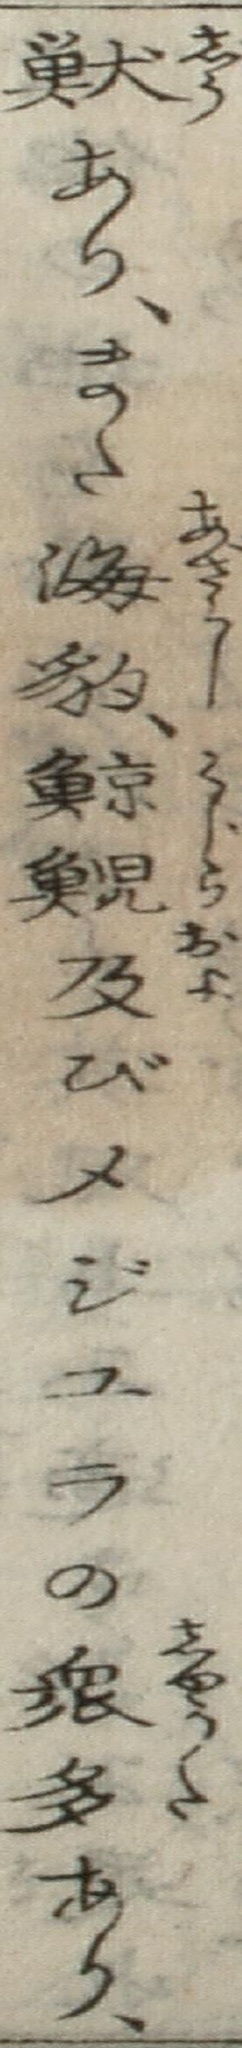獣あり、また海豹、鯨鯢及びメジユラの衆多あり、
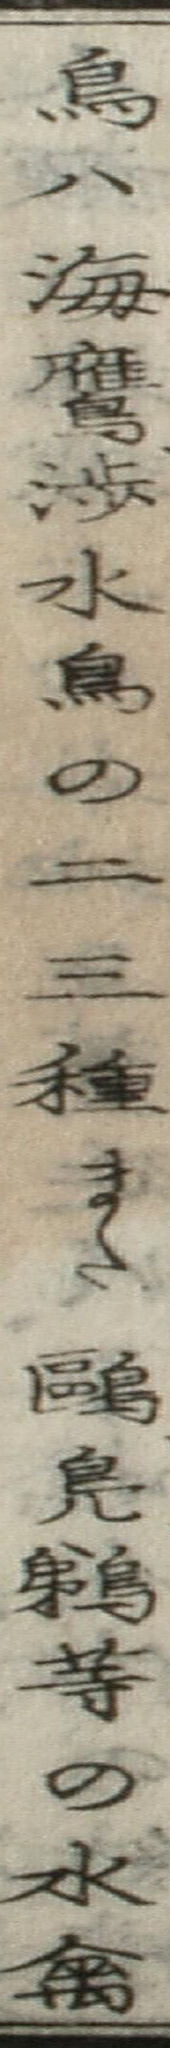鳥は海鷹、渉水鳥の二三種、また鴎、鳬、鵜等の水禽
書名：訓蒙　天然地理學　下
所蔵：東京大学地震研究所図書室 Earthquake Research Institute Library, The University of Tokyo, JAPAN
